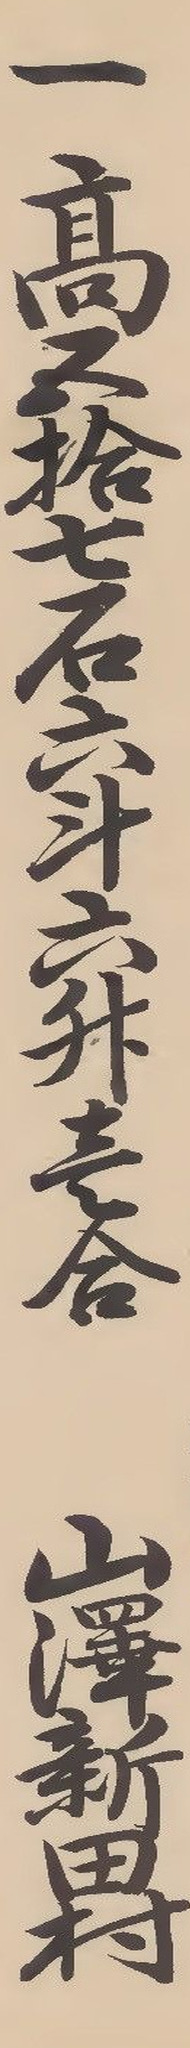一高五拾七石六斗六升壱合山沢新田村
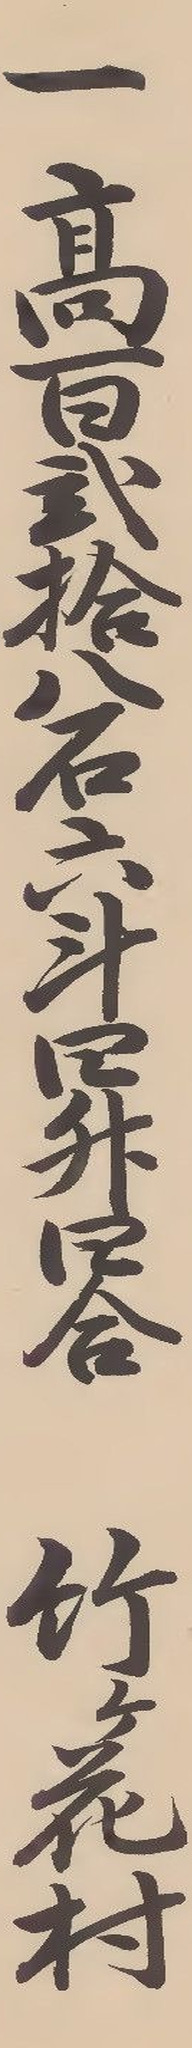一高百弐拾八石六斗四升四合竹ヶ花村
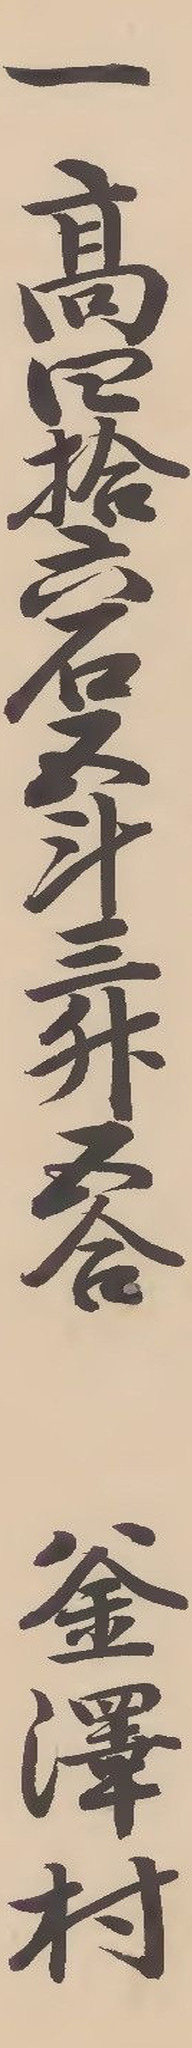一高四拾六石五斗三升五合釜沢村

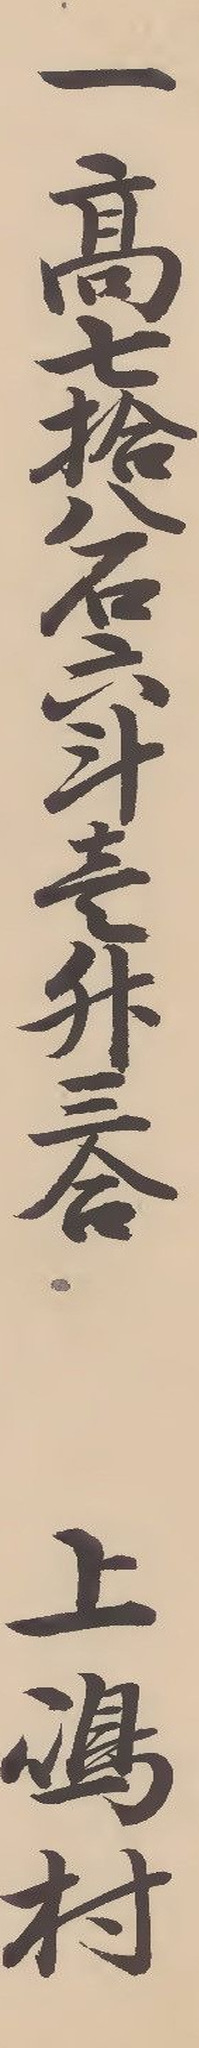一高七拾八石六斗壱升三合上島村
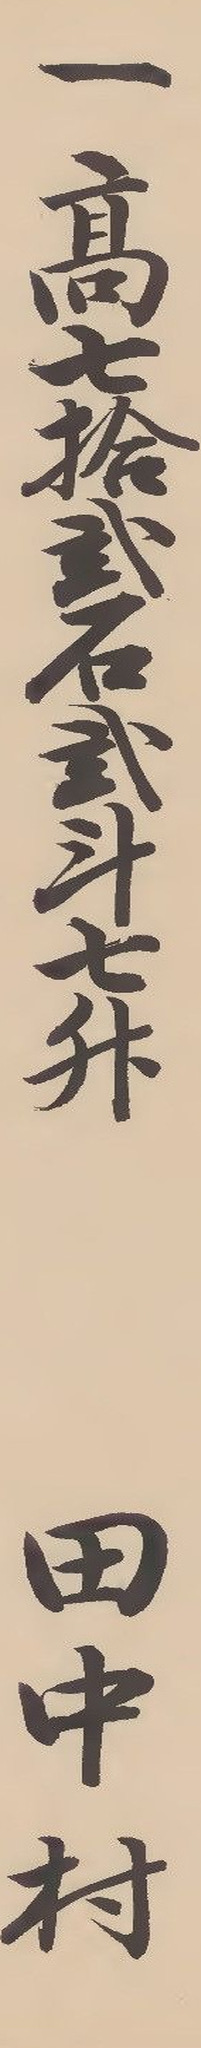一高七拾弐石弐斗七升田中村
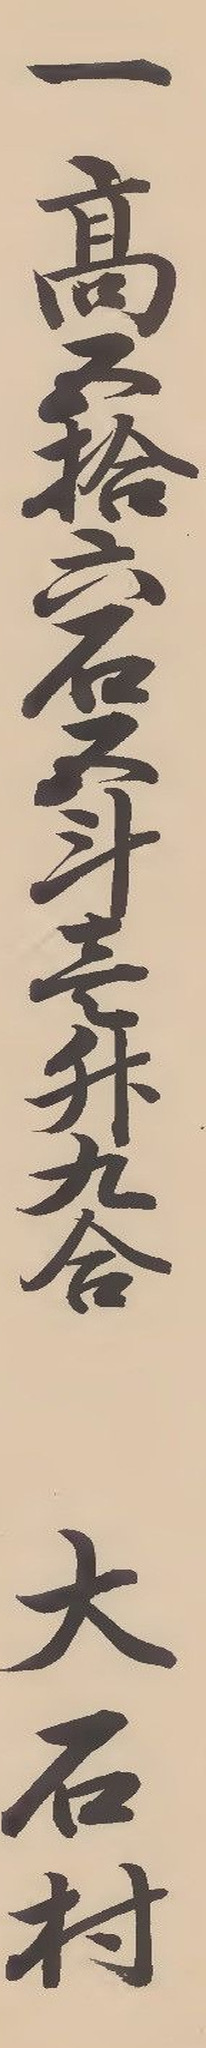一高五拾六石五斗壱升九合大石村
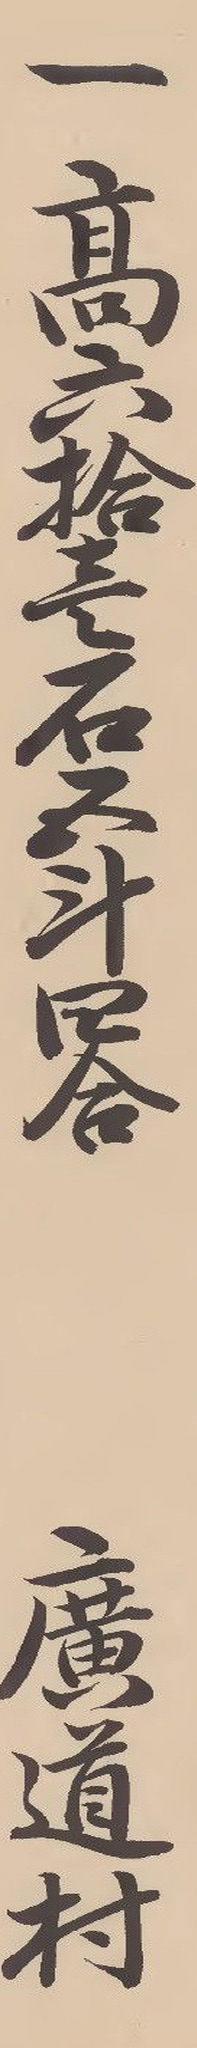一高六拾壱石五斗四合広道村
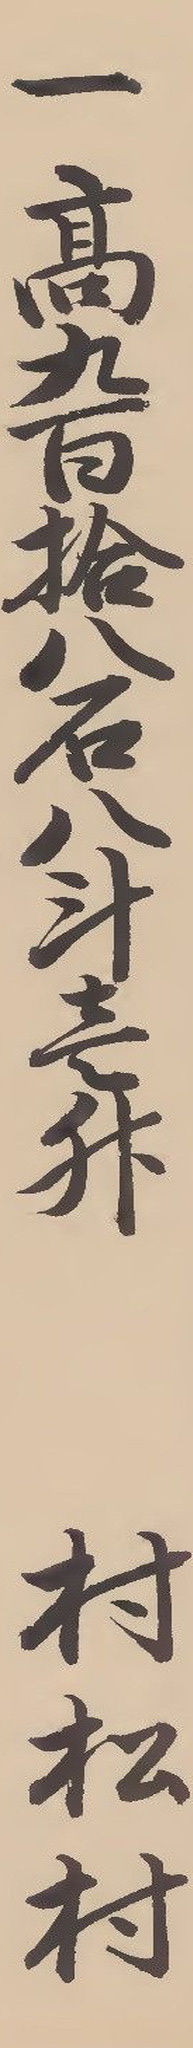一高九百拾八石八斗壱升村松村
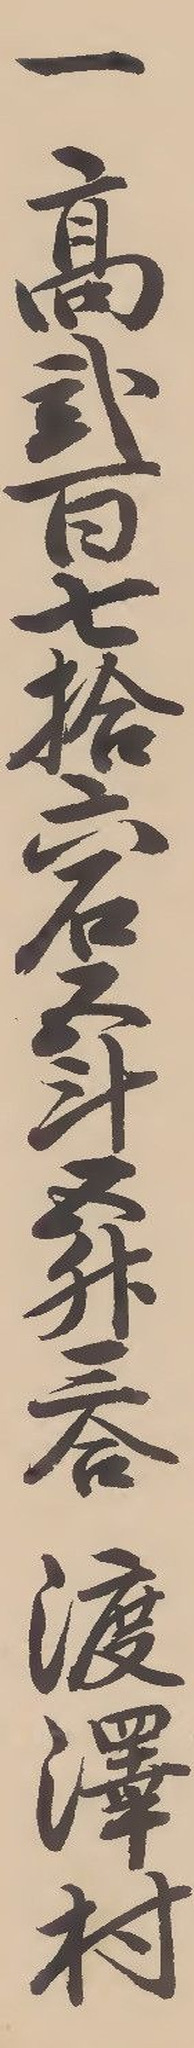一高弐百七拾六石五斗五升三合渡沢村
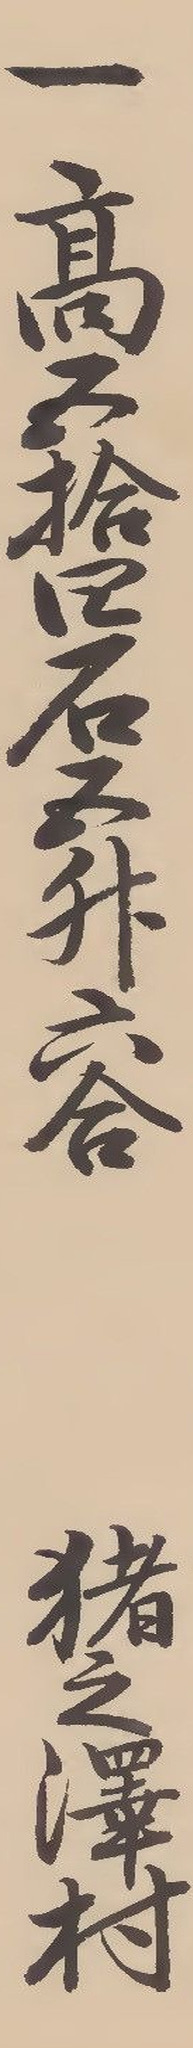一高五拾四石五升六合猪之沢村
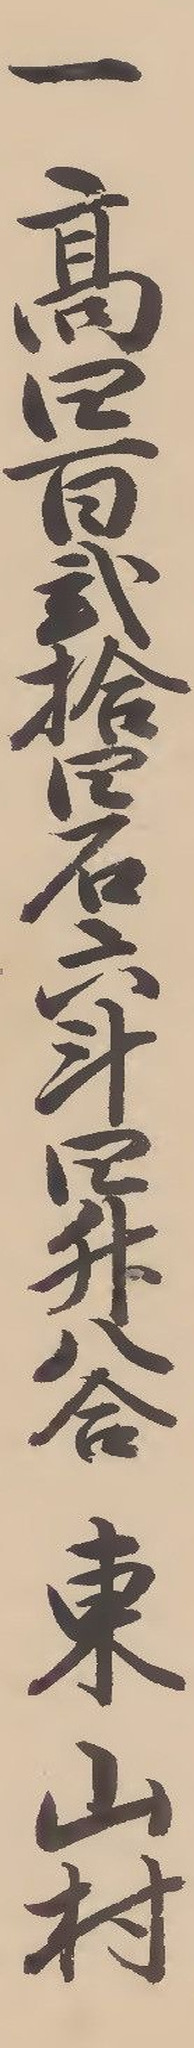一高四百弐拾四石六斗四升八合東山村

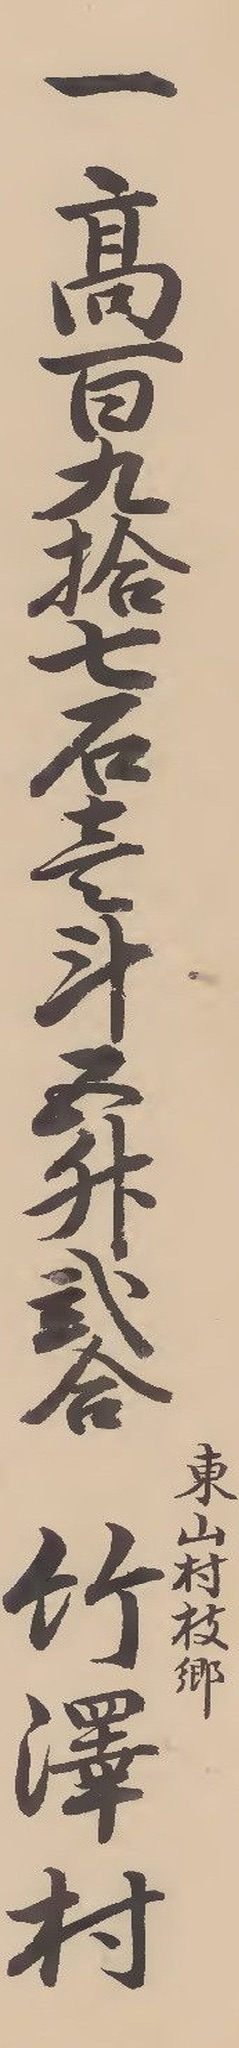一高百九拾七石壱斗五升弐合竹沢村
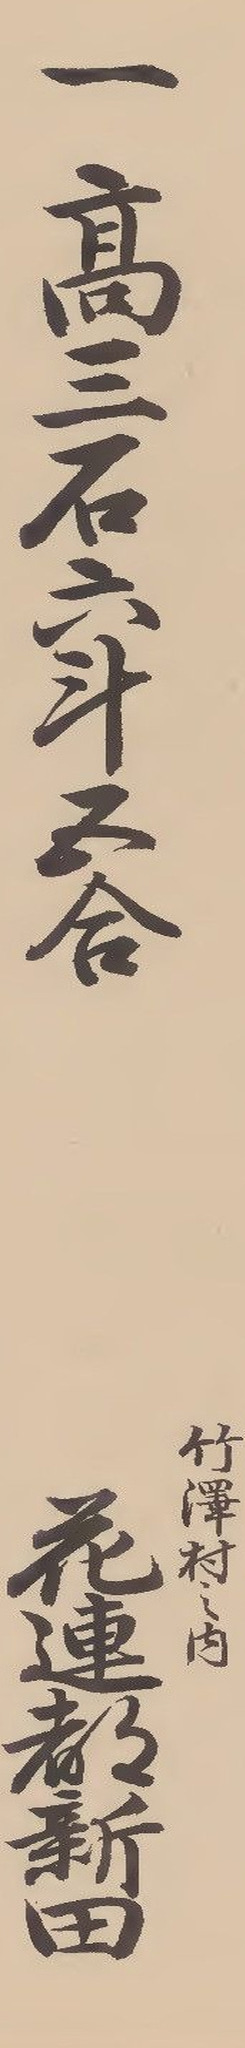一高三石六斗五合花連都新田
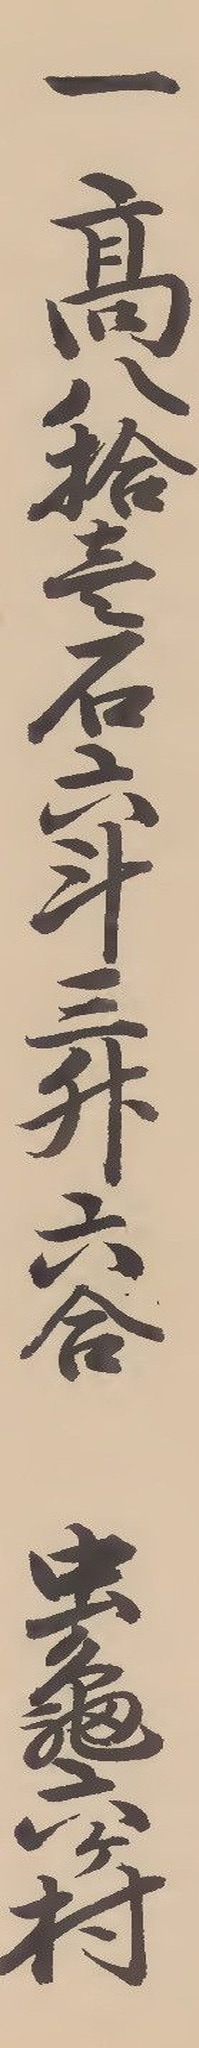一高八拾壱石六斗三升六合虫亀六ヶ村
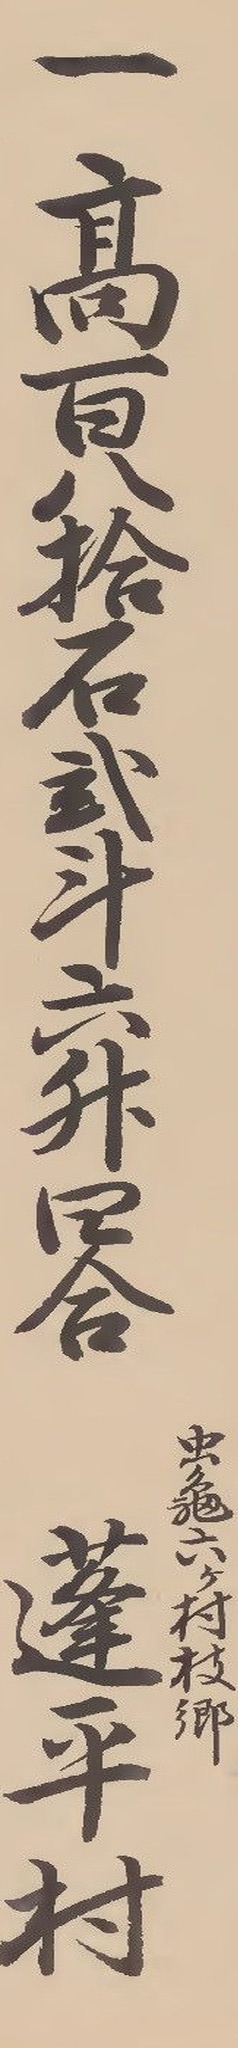一高百八拾石弐斗六升四合蓬平村
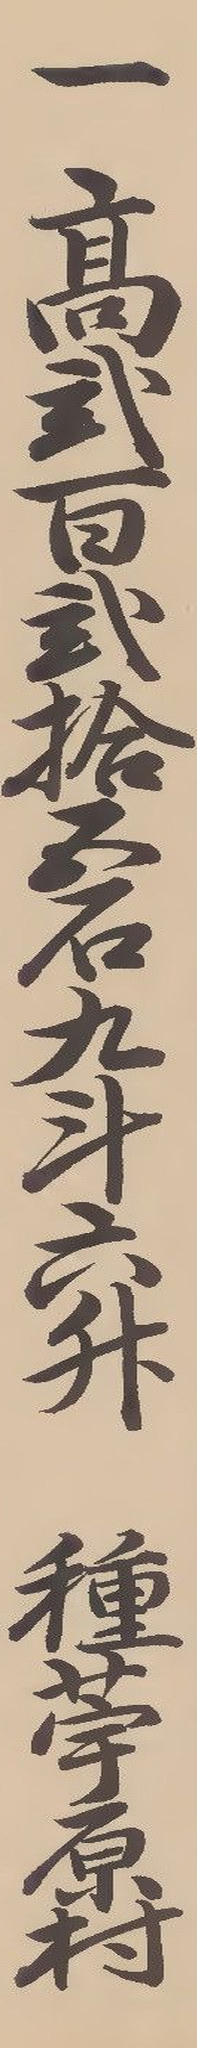一高弐百弐拾五石九斗六升種荢原村
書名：越後国郷帳　中
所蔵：国立公文書館 National Archives of Japan
